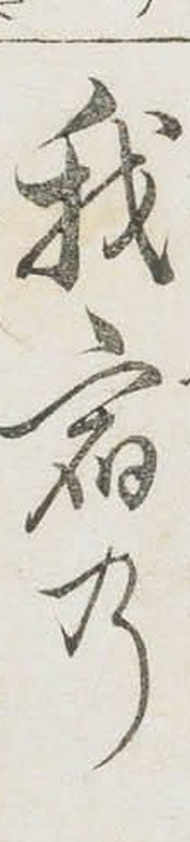我宿の
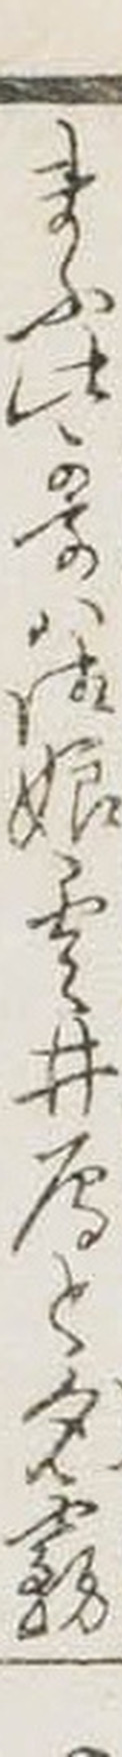まふ此哥は御娘雲井雁と夕霧
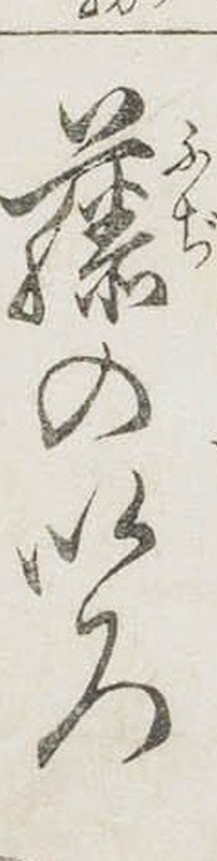藤のいろ
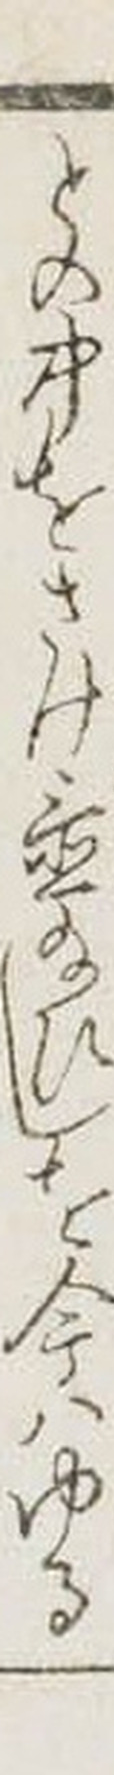との中をさけ置給ひしを今はゆる
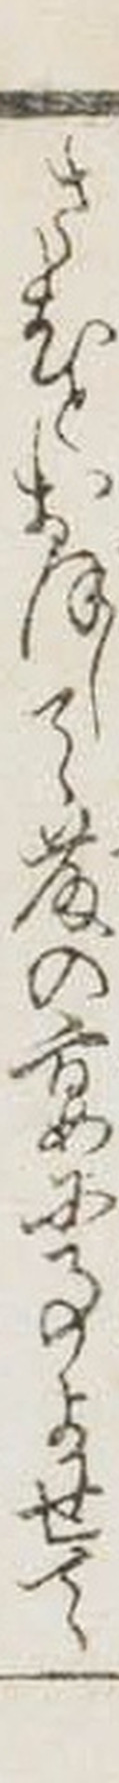さむとおぼして藤の宴に事よせて
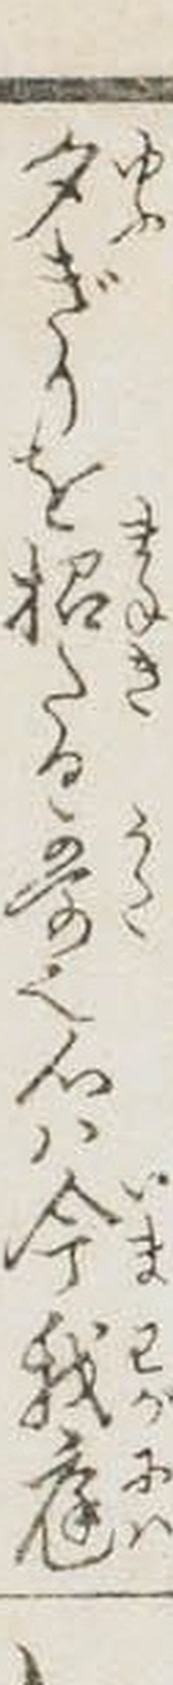夕ぎりを招たる哥也心は今我庭
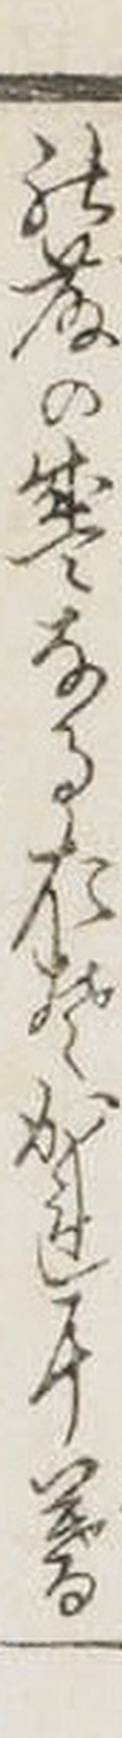の藤の盛なるたそかれに暮
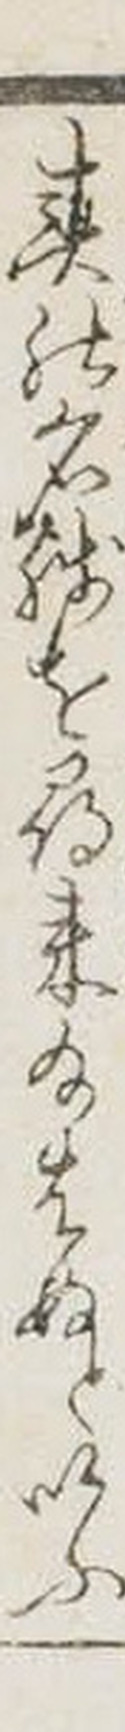春の名残を尋来給はぬといふ
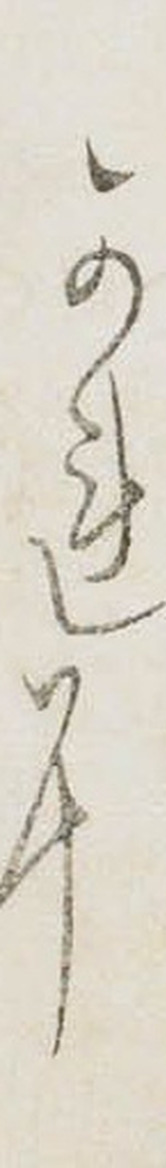かれに
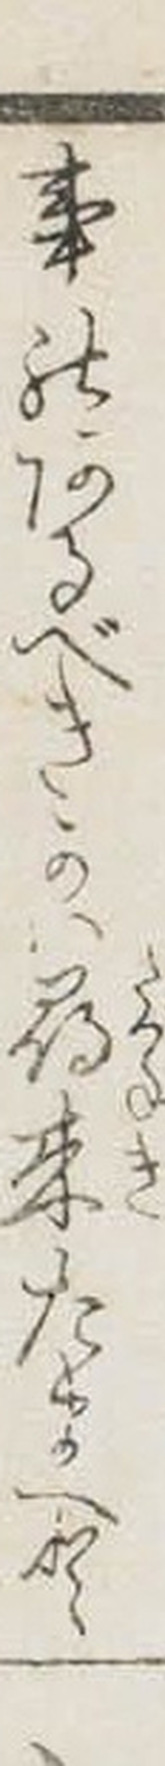事のあるべきかは尋来たまへと
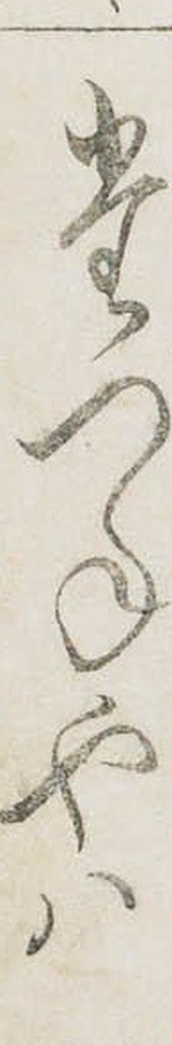たづねやは
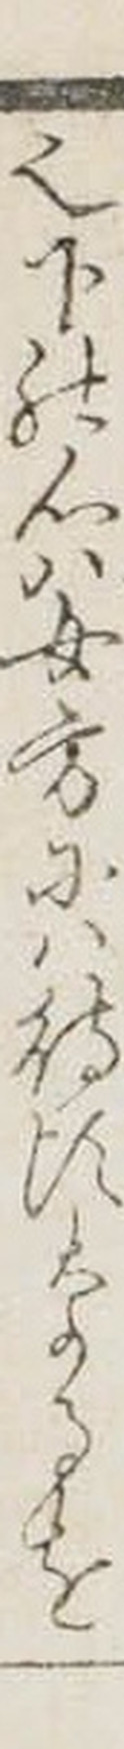也下の心は女方には待頃なるを
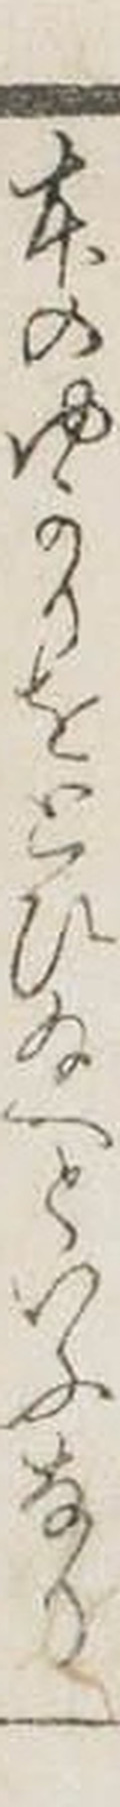本のゆかりをとひ給へといふなり
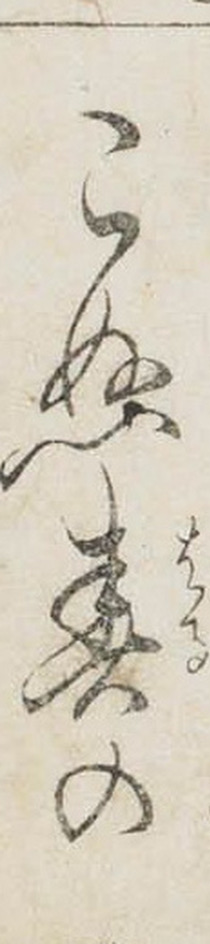こぬ春の
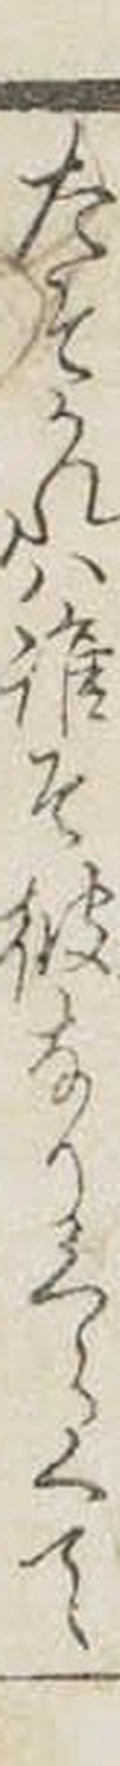たそかれは誰そ彼なりくらくて
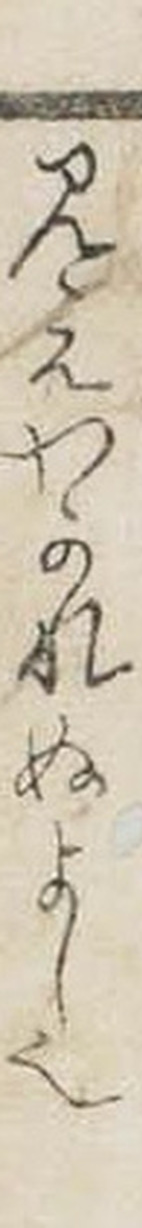見えわかれぬよし也
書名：源氏百人一首
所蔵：東京学芸大学教育コンテンツアーカイブ
